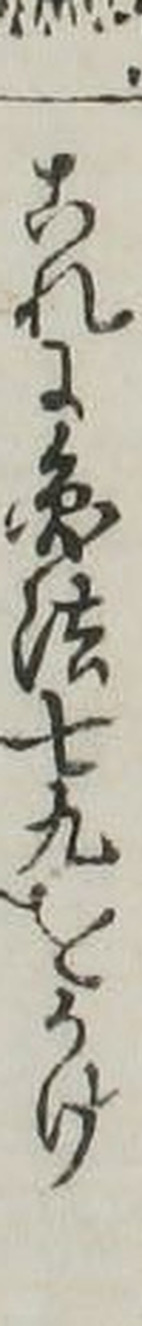これに円法七九をかけ
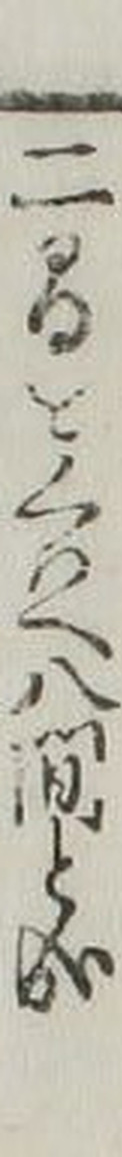二間をくはへ八間と成
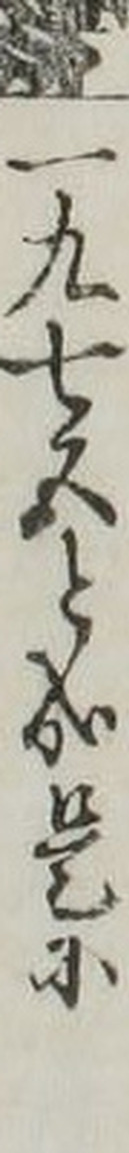一九七五と成是に
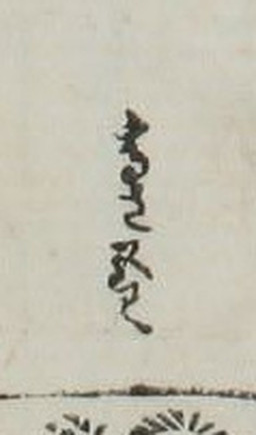高さ五尺
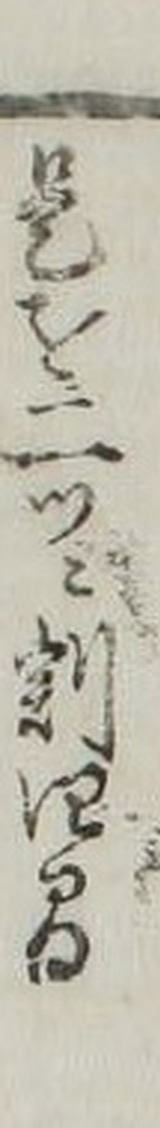是を二ツに割四間
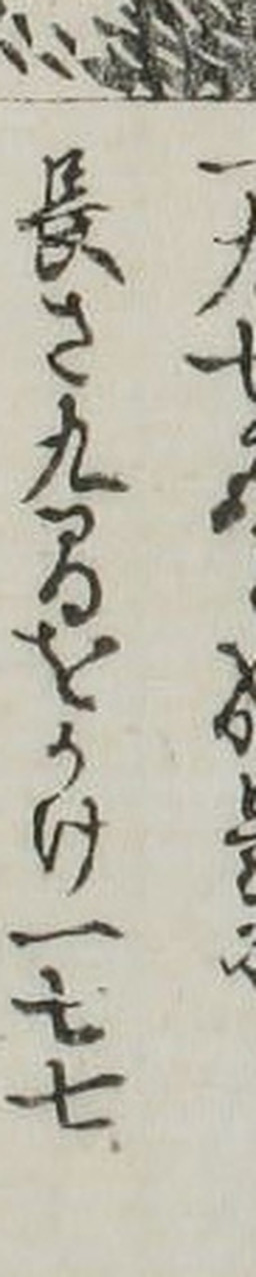長さ九間をかけ一七七
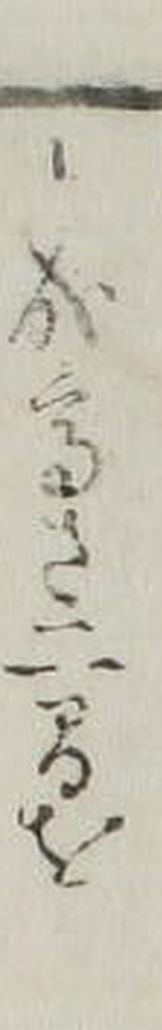と成高さ二間を
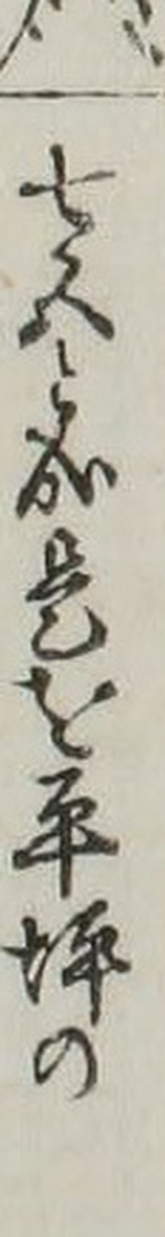七五と成是を平坪の
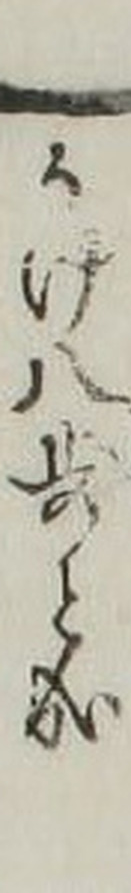かけ八歩と成
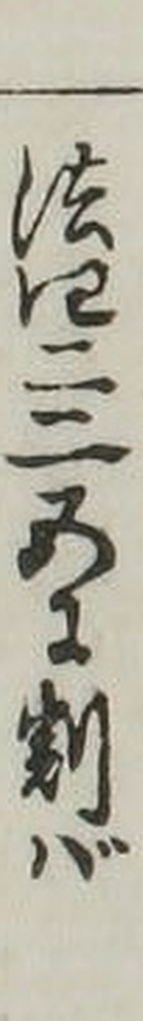法四二二五に割ば
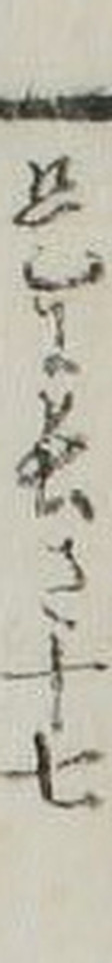是に長さ十七
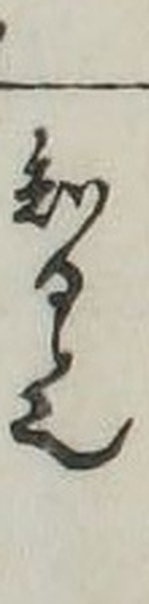知るゝ也
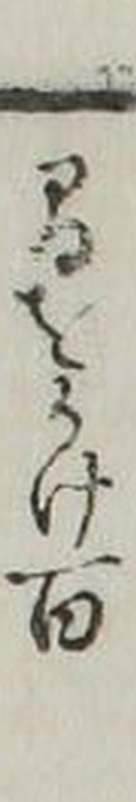間をかけ百
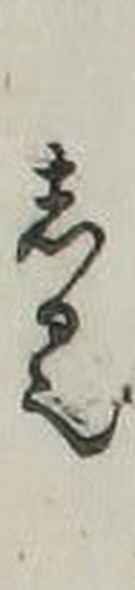しる也

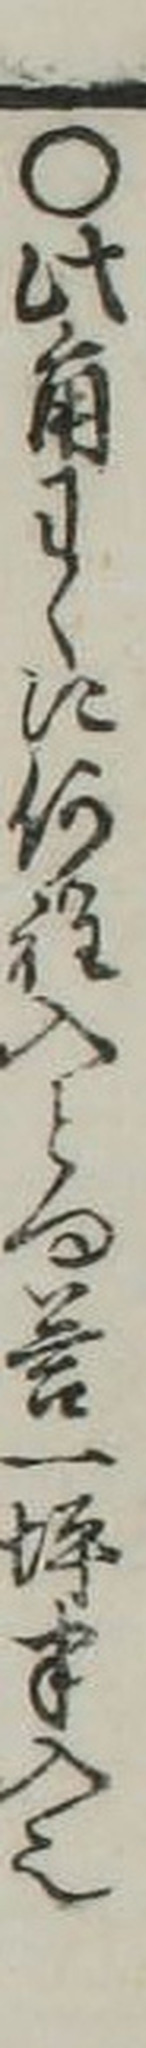○此角わくに何程入と問答一坪半入也
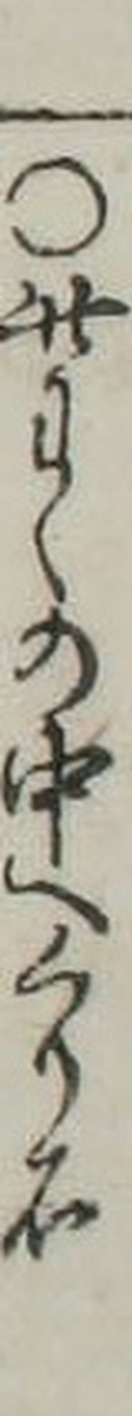○此わくの中へくり石
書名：宝玉塵劫記
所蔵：東京学芸大学教育コンテンツアーカイブ
